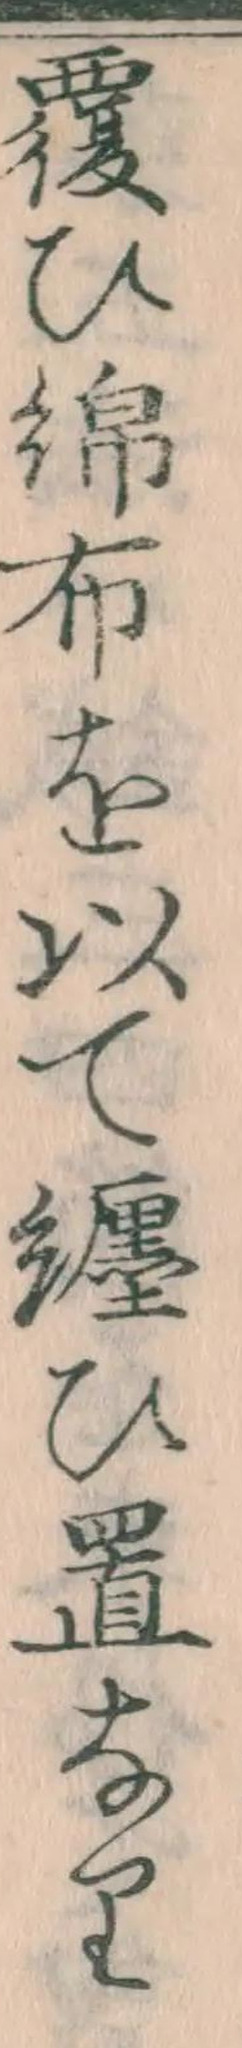覆ひ綿布を以て纏ひ置なり
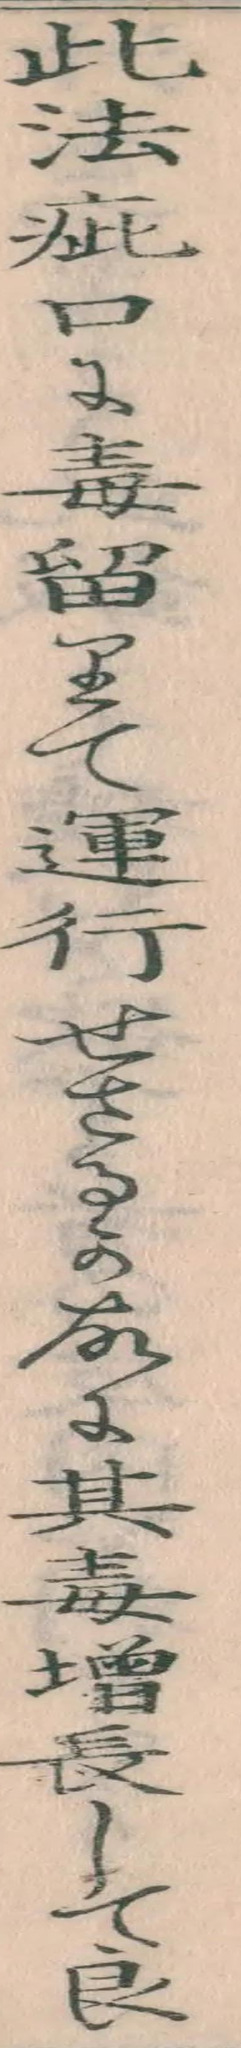此法疵口に毒留りて運行せさるか故に其毒増長して良
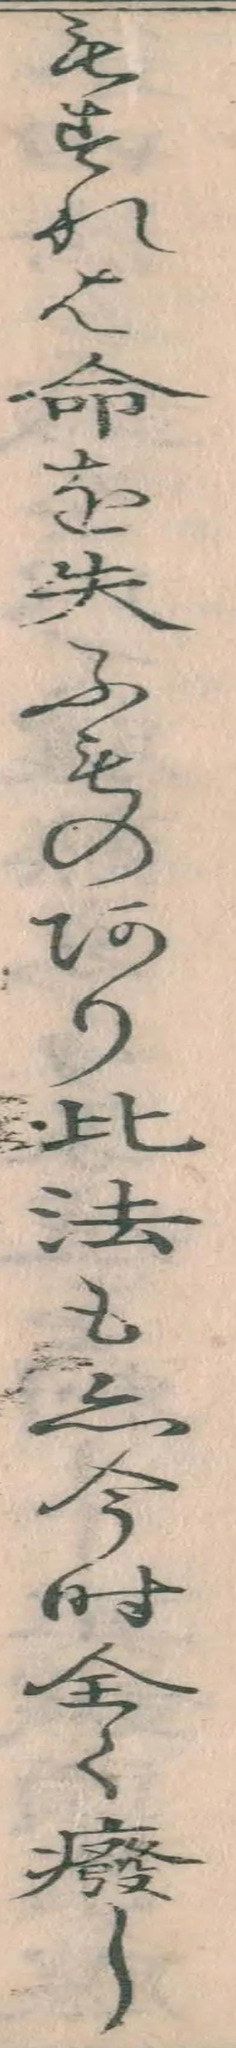もすれは命を失ふものあり此法もし今時全く廃し
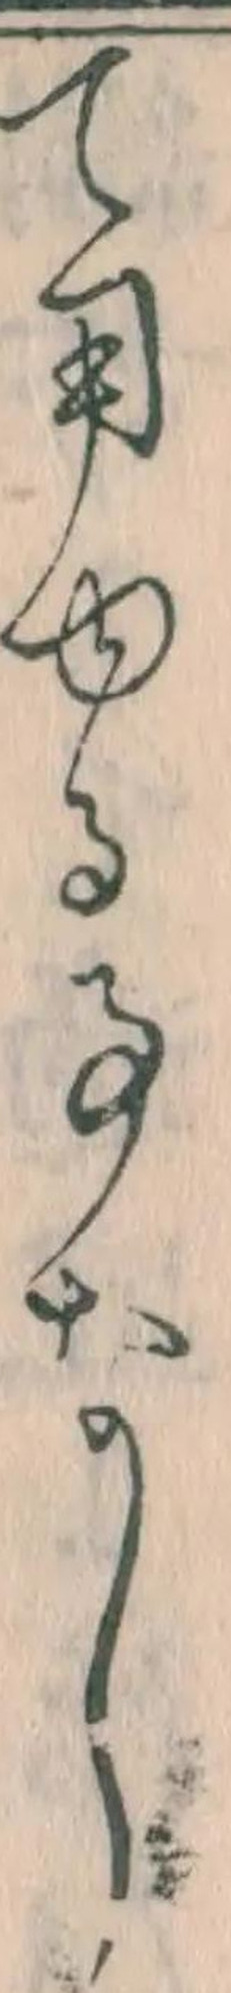て用ゆる事なく
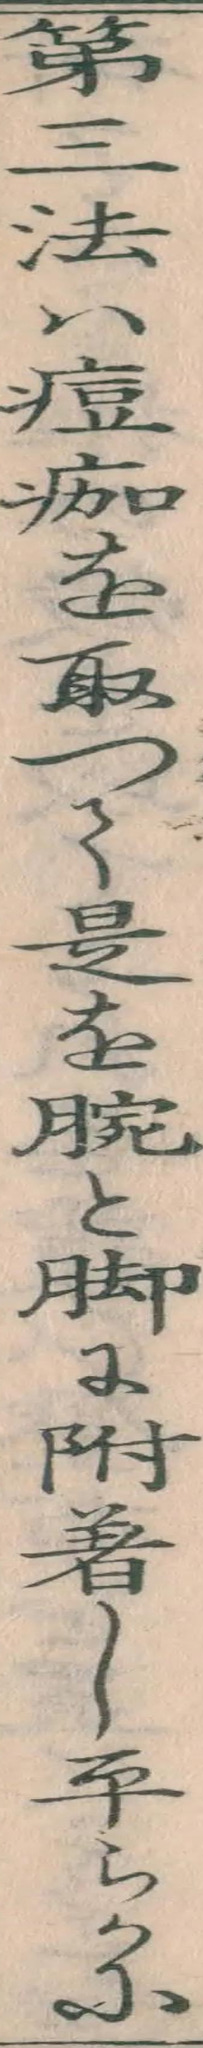第三法は痘疵を取つて是を腕と脚に附着し平らかに

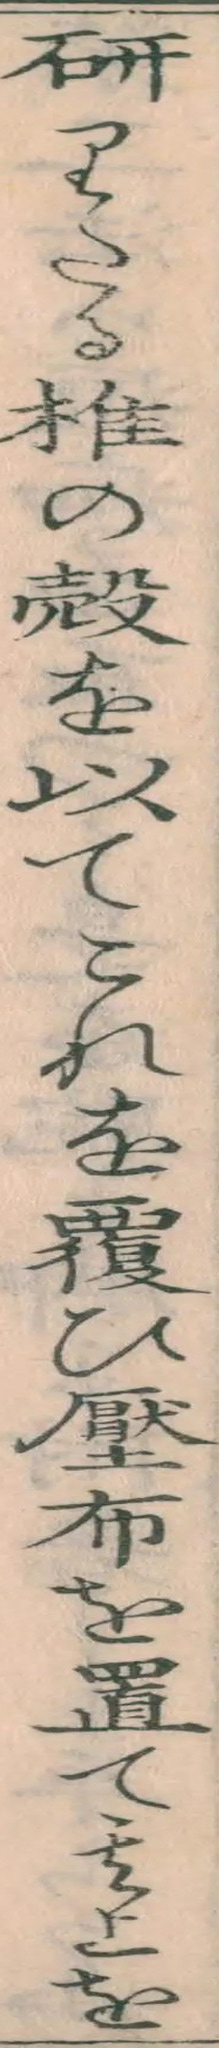研りたる椎の殻を以てこれを覆ひ厭布を置れ其上を
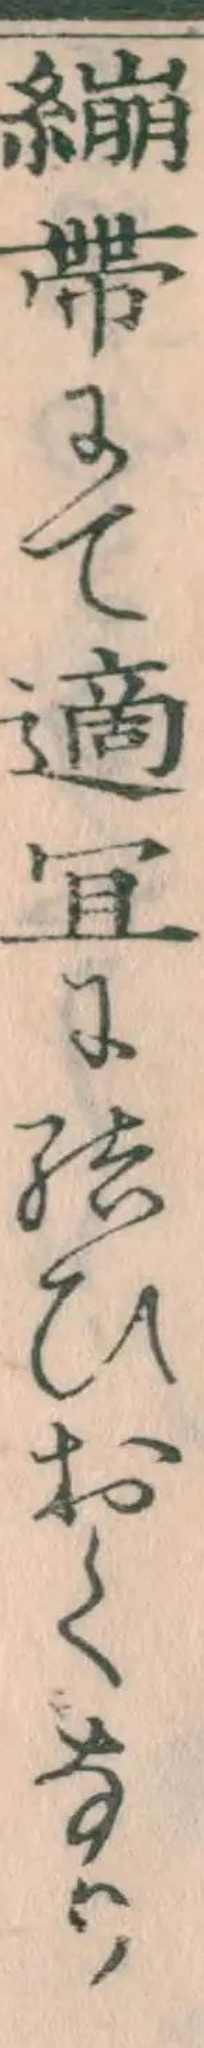繃帯に適宜に結ひおくなり
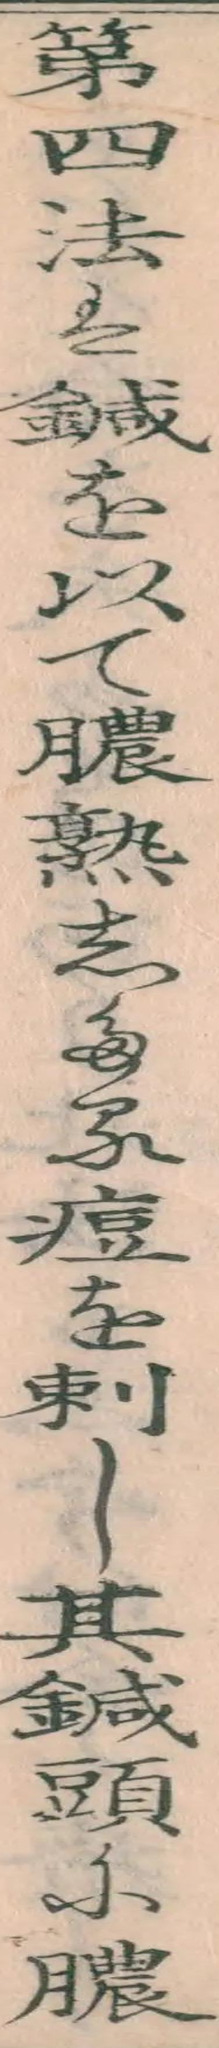第四法は鍼を以て膿熟したる痘を刺し其鍼頭に膿
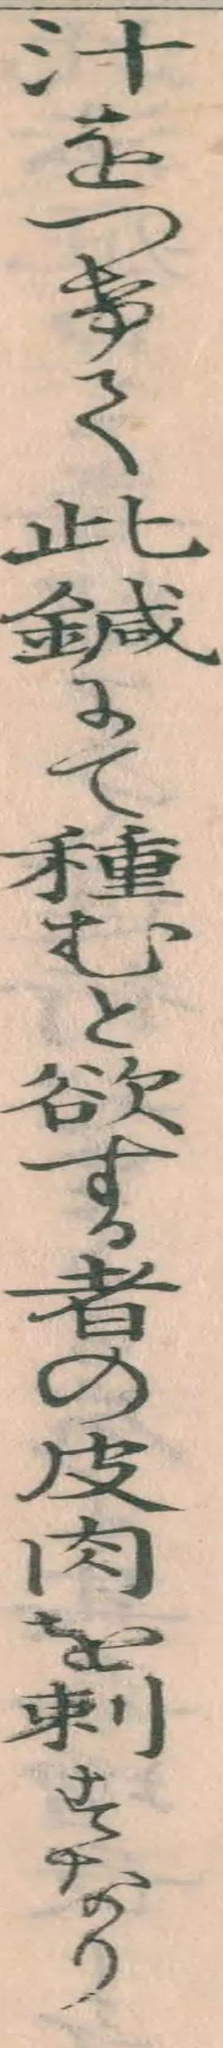汁をつけて此鍼にて種むと欲する者の皮肉を刺すなり
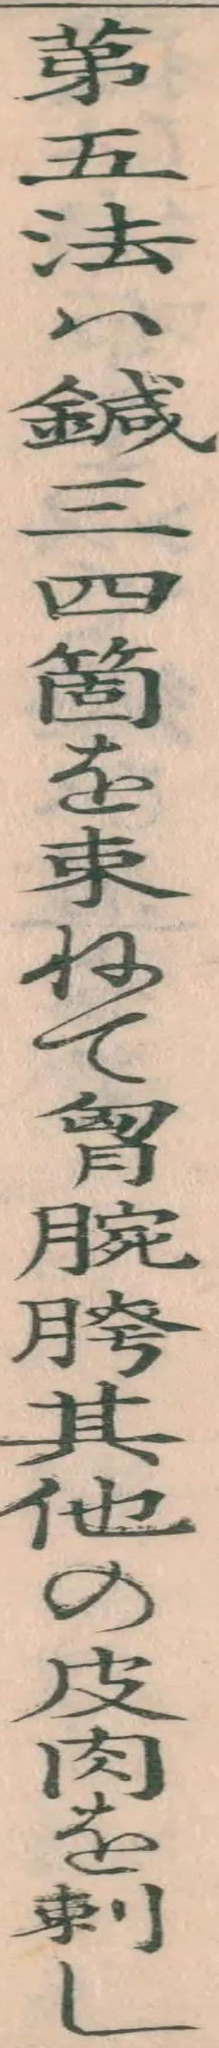第五法は鍼三四箇を束ねて胸腕袴其他の皮肉を刺し
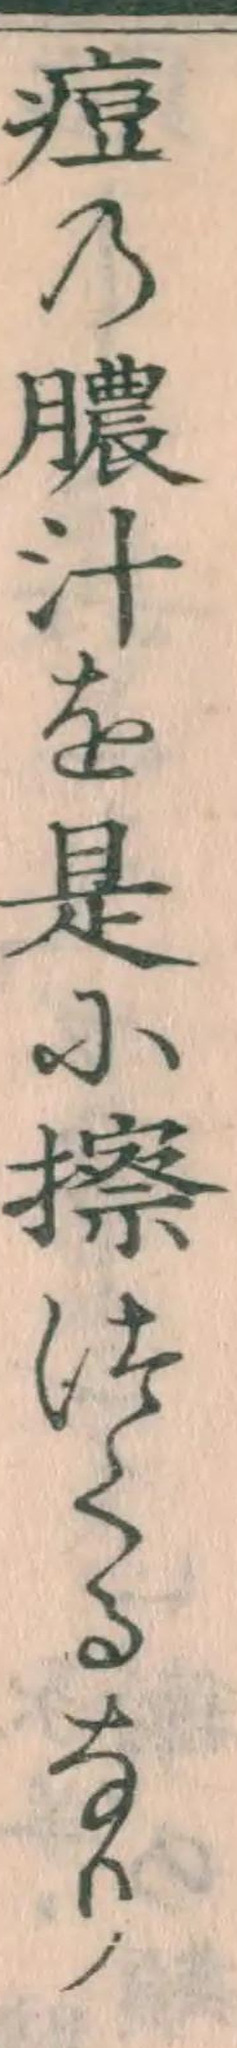痘の膿汁を是に擦つくるなり
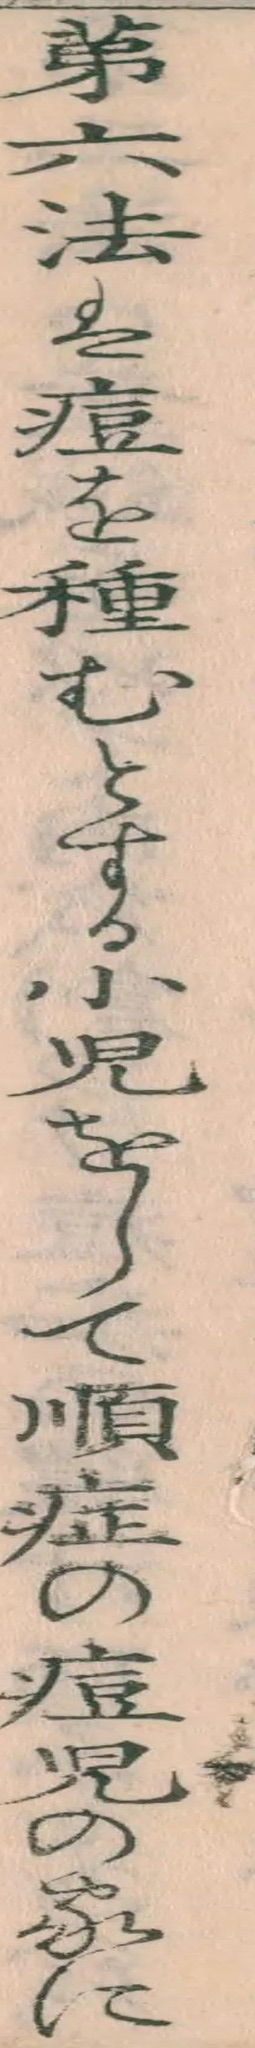第六法は痘を種むとする小児をして順症の痘児の家に
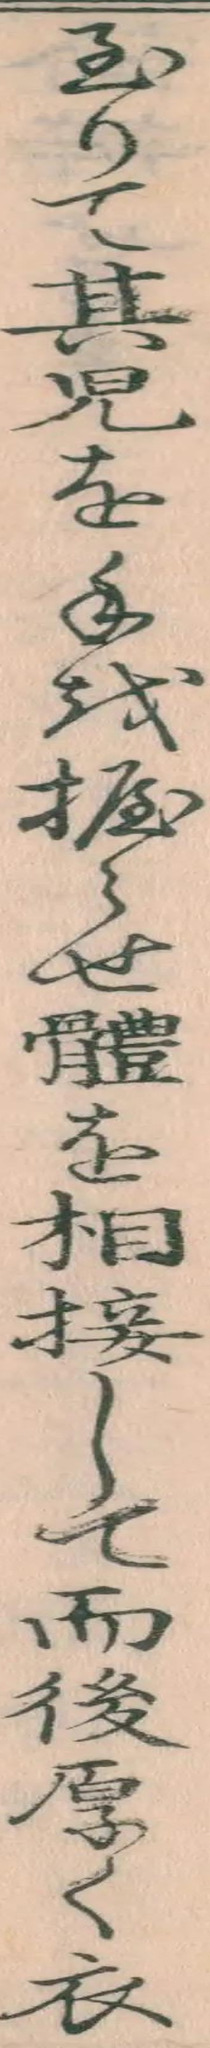至りて其児を手を握らせ體を相接して而後厚く衣
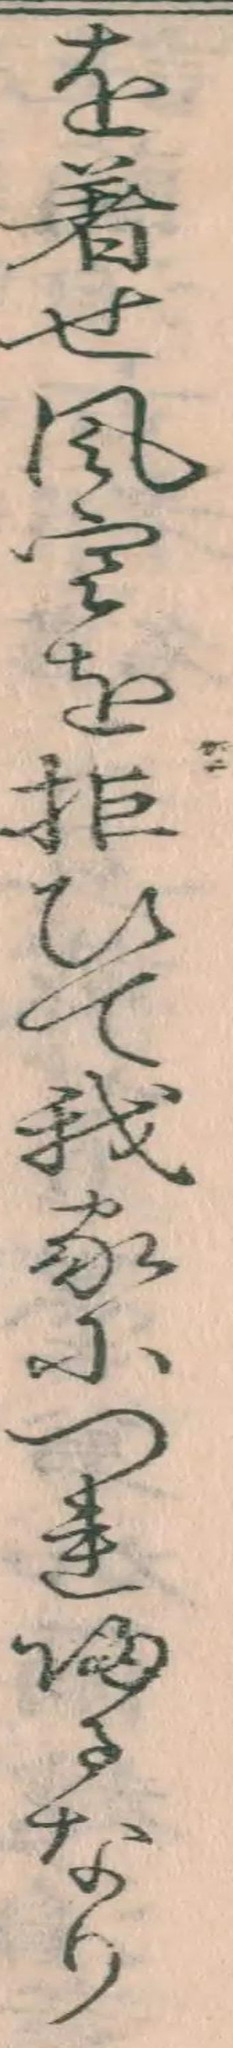を着せ風寒を拒ひて我家につれ帰るなり
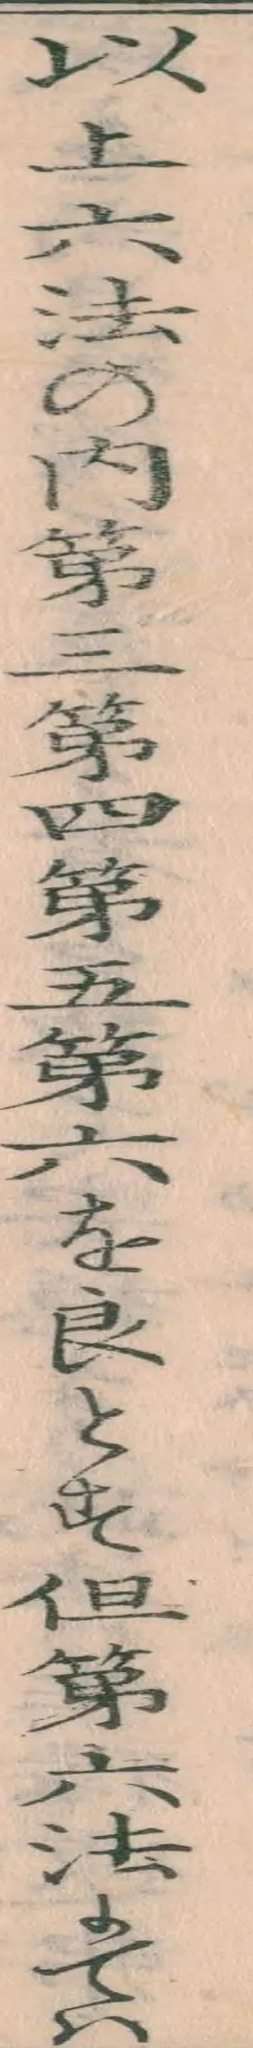以上六法の内第三第四第五第六を良とす但第六法にては
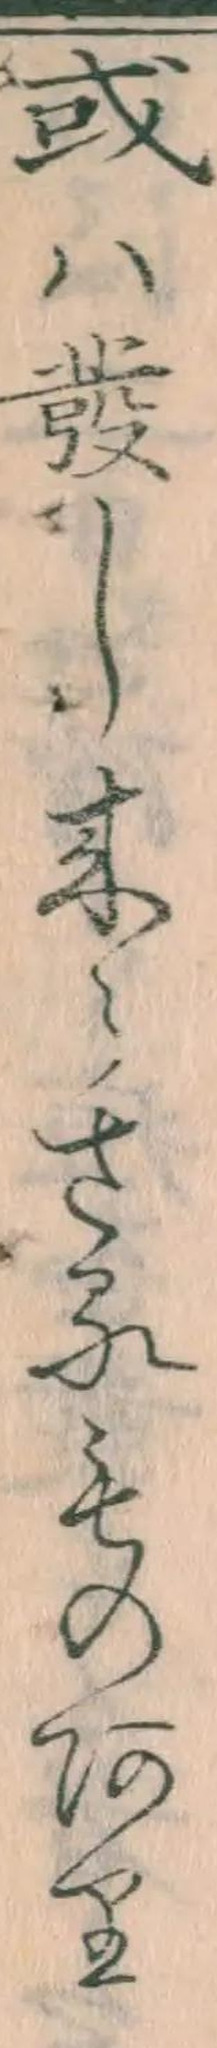或は發し来らさるものあり
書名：種痘新編
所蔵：国立国会図書館 National Diet Library, JAPAN
